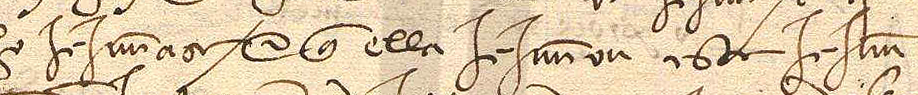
ho JeJūuase / e q̄ ella JeJūuou este JeJūu
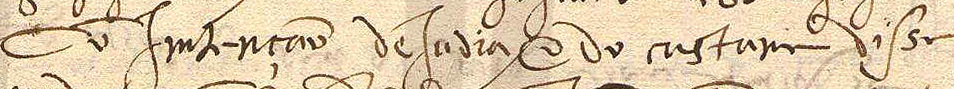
Cō Jmtenção de Judia / e do custume disse
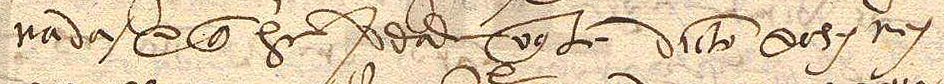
nada / e q̄ he ꝟdade o q̄ tē dic̄to e asyney
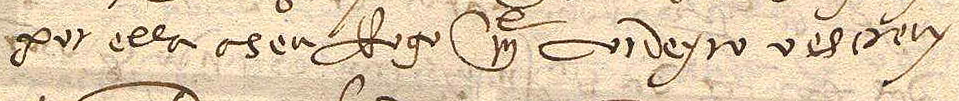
por ella a seu Rogo mel Cordeyro o escreuy
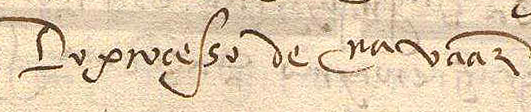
Do processo de Cna vāaz
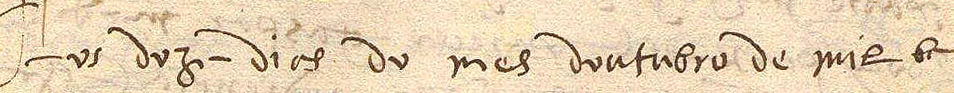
Aos doze dias do mes doutubro de mil bc
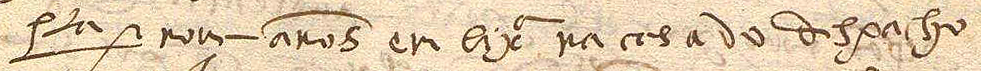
Lta e noue ānos em lixa na casa do despacho
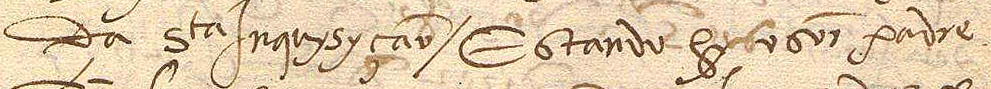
da Sta Inquysyção / Estando hy o sōr padre
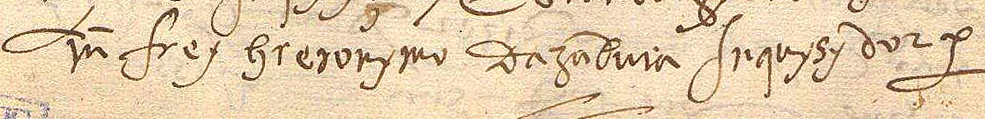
mte frey hieronymo dazābuia Jnquysydor ꝑ
